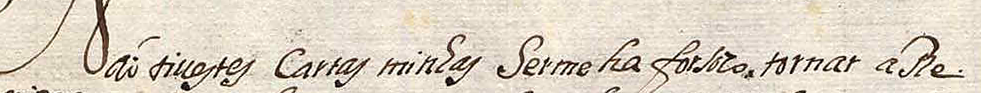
Naõ tiuestes Cartas minhas Ser me ha forsozo. tornar a Re
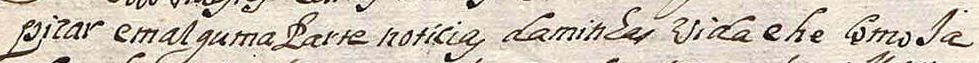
pizar em alguma Parte noticias da minhas vida e he como Ia
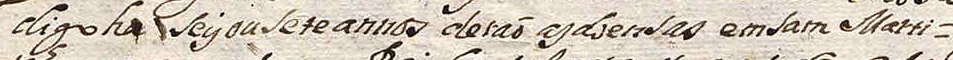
digo ha seis ou sete annos de taõ as doensas em sam Marti
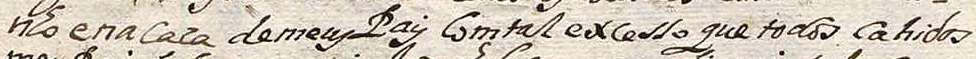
nho e na caza de meus Pay com tal excesso que todos cahidos
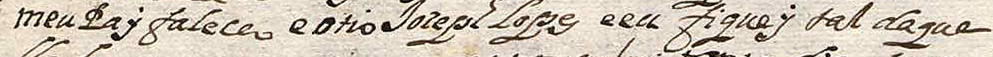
meu Pay faleceo e o tio Iozeph Lopes e eu fiquey tal daque
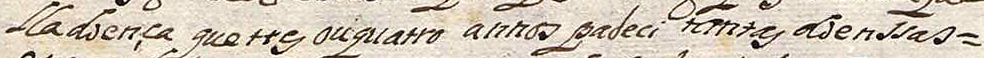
lla doença que tres ou quatro annos padeci tantas doenssas
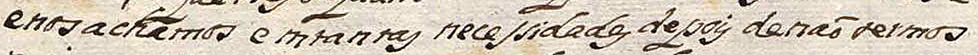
e nos achamos em tantas necessidades depois de naõ termos
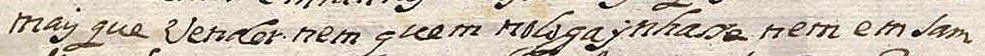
mais que vender nem quem nolo gaynhasse nem em sam
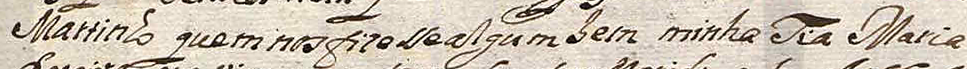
Martinho quem nos fizesse algum bem minha Tia Maria
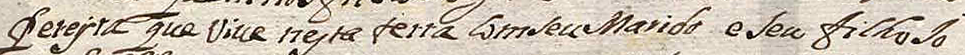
Pereyra que viue nesta terra com seu Marido e seu filho Io
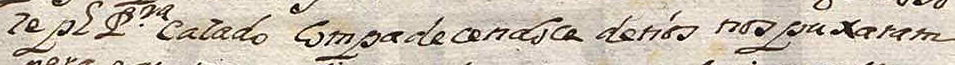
zeph P.ra cazado compadecendoce de nós nos puxaram
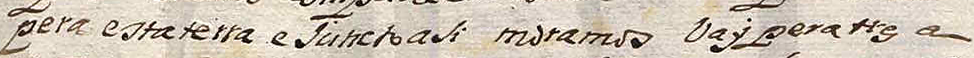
pera esta terra e Iuncto a si moramos vay pera tres a
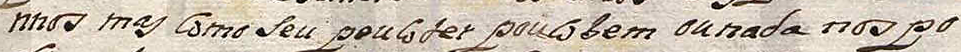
nnos mas como seu pouco ter pouco bem ou nada nos po
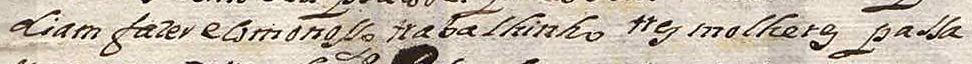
diam fazer e com o nosso trabalhinho tres molheres passa
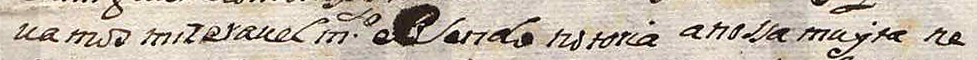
uamos mizerauelm.te e Sendo notoria a nossa muyta ne
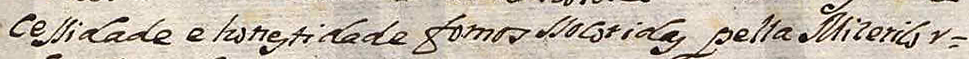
cessidade e honestidade fomos ssocoridas pella Mizericor
